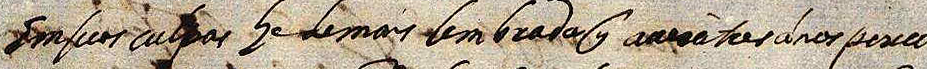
Em suas culpas he de mais lembrada q̄ auia tres an̄os pouco
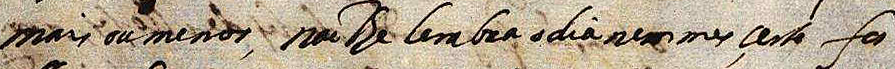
mais ou menos, naõ lhe lembra o dia nem mes çerto foi
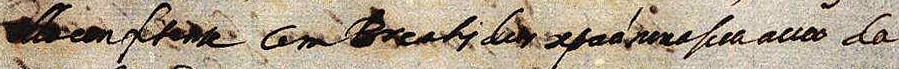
_lla confitente com Breatis dias xpaã noua sua auoo da
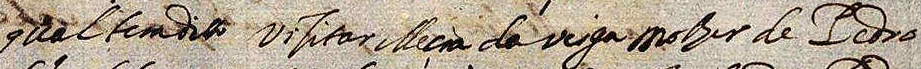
qual tem ditto visitar Meçia da veiga molher de Pedro
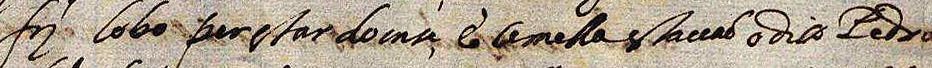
frz̄ lobo per estar doente, e com ella estauaõ o ditto Pedro
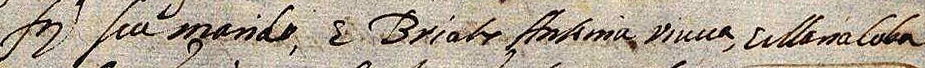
frz̄ seu marido, E Briatis Antonia viuua, E Maria loba
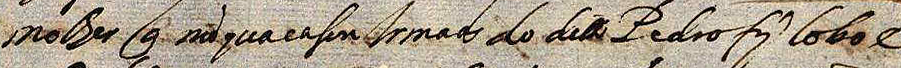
molher q̄ nūqua casou Irmaõs do ditto Pedro frz̄ lobo e
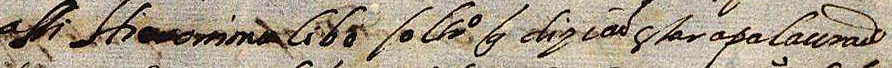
assi Hi__onimo lobo soltro q̄ diziaõ estar apalaurado
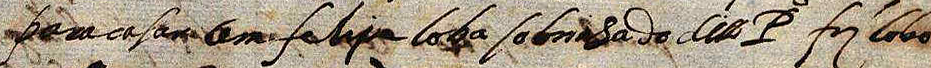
para casar com felipa loba sobrinha do ditto Po frz̄ lobo
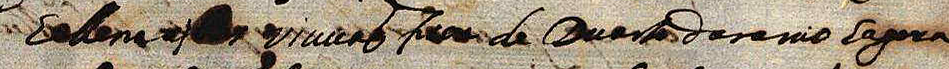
E ellena aj__s viuua q̄ ficou de Duarte do ramo E agora
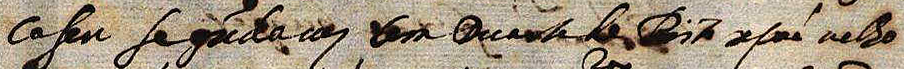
casou segūda uez Com Duarte de Brito xpaõ uelho
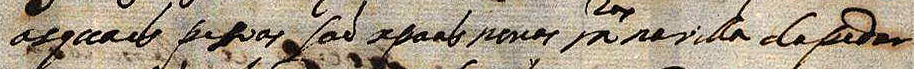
as quaes pessoas saõ xpaas̄ nouas moradoras na villa da peder
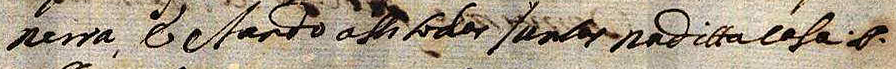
neira, e estando assi todas Juntas na ditta casa .ss.
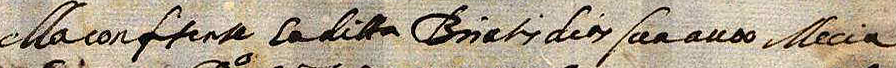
ella confitente E a ditta Briatis dias sua auoo Mecia
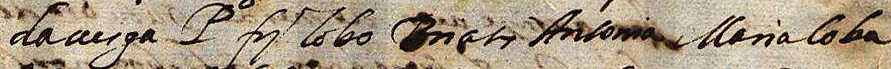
da ueiga Po frz̄ lobo Briatis Antonia Maria loba
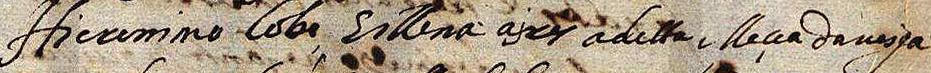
Hieronimo Lobo, E ellena ajres a ditta Meçia da ueiga
